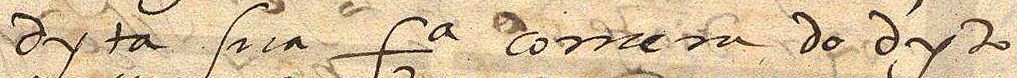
dyta sua fa comera do dyto
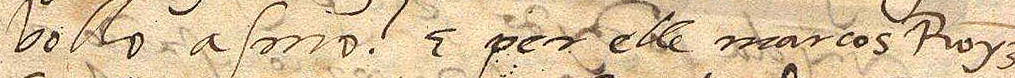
bollo asmo? E per elle marcos Rōyz
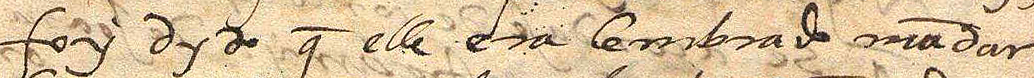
foy dyto q̄ elle era lembrado mādar
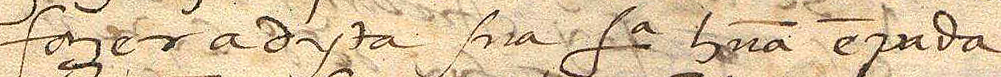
fazer a dyta sua fa hūa ēpada
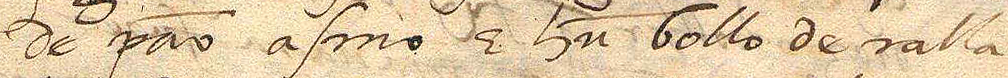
de pão asmo E hū bollo de ralla
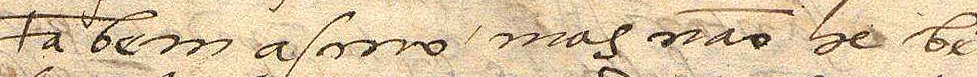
tābem asmo mas não he bē
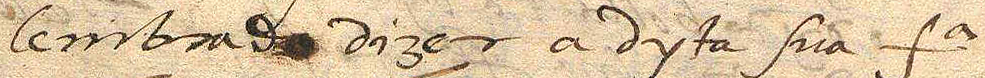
lembrado dizer a dyta sua fa
